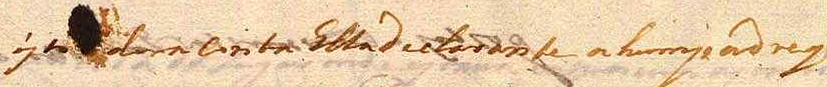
isto dara conta Ella declarante a hum padre q̄
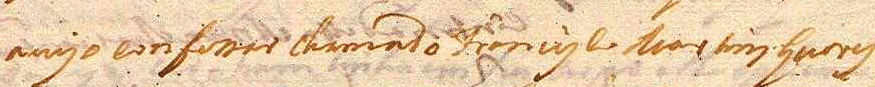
a ujo confessar chamado Francisco Martins Quores
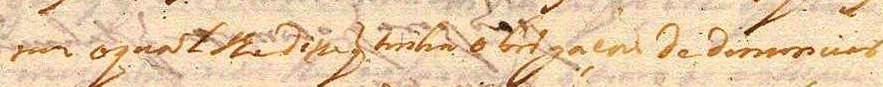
ma o qual lhe disse q̄ tinha obrigaçaõ de denunciar
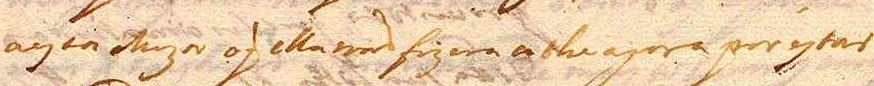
a esta Meza o q̄ ella naõ fizera athe agora por estar
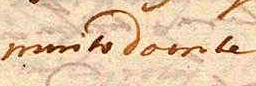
muito doente
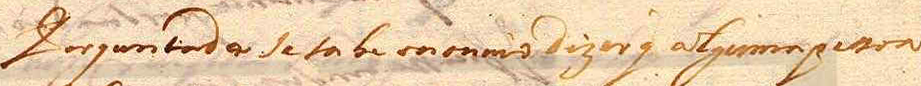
Perguntada se sabe ou ouuio dizer q̄ alguma pessoa
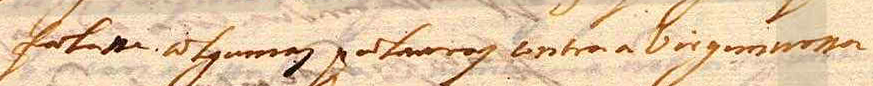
falasse algumas palauras contra a Virgem nossa
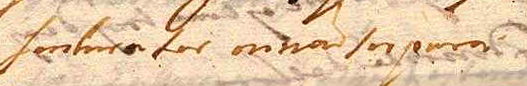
Senhora ser ou naõ ser pura
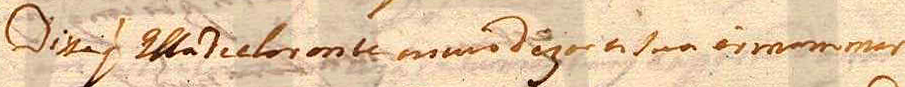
Disse q̄ Ella declarante ouuio dizer a sua irmam mar
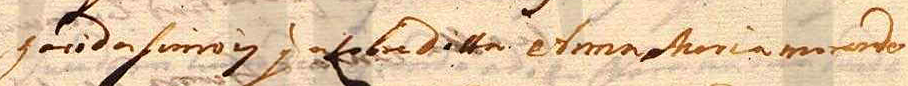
garida simois q̄ a sobreditta Anna Maria morando
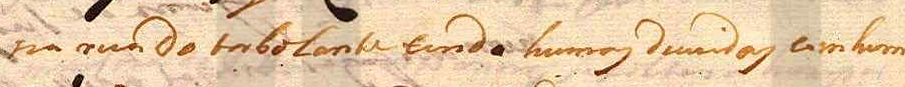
na rua do torbolante tendo humas duuidas com hum
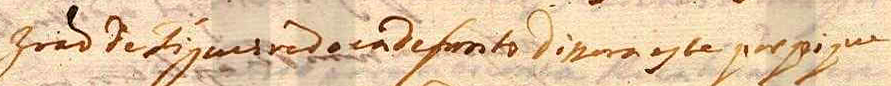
Joaõ de Figueiredo ia defunto dissera este por pique
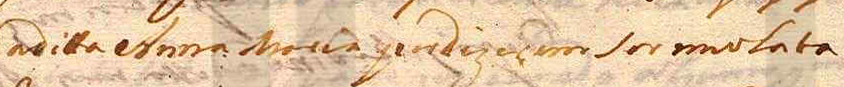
a ditta Anna Maria por dizerem ser molata
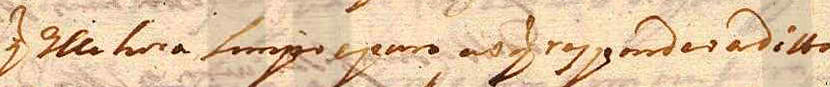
q̄ Elle hera limpo e puro, ao q̄ respondeo a ditta
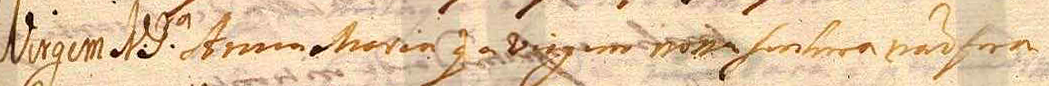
Anna Maria q̄ a Virgem nossa Senhora naõ fora
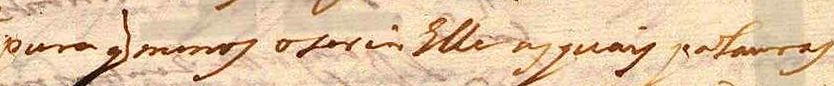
pura q̄ menos o seria Elle as quais palauras
